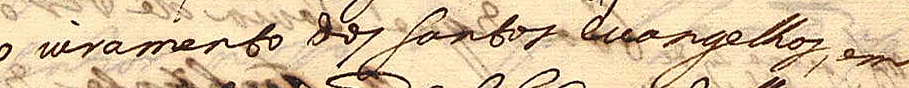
o iuramento dos Santos Euangelhos, em
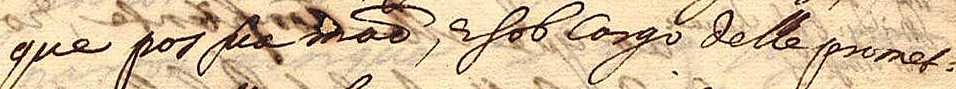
que pos sua mão, E sob cargo delle promet
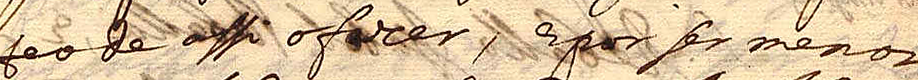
teo de assi o fazer, E por ser menor
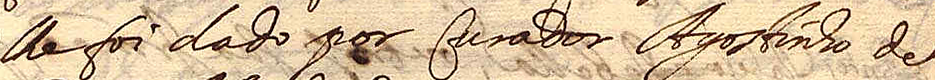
lhe foi dado por Curador Agostinho de
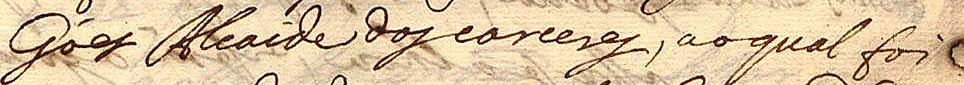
Góes Alcaide dos carceres, ao qual foi
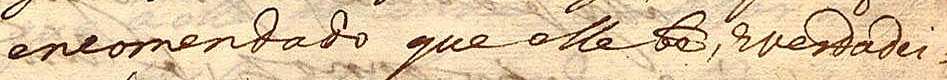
encomendado que elle b̄e, E verdadei
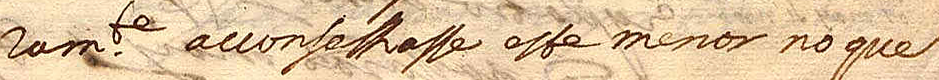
ram.te accomselhasse este menor no que
